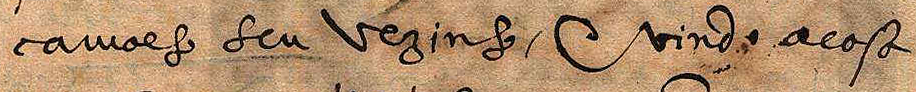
carualho seu vezinho / e vindo a casa
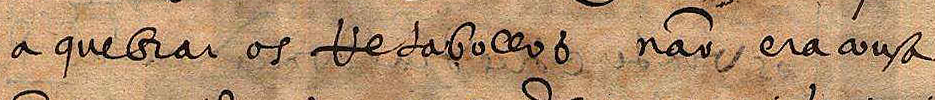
a quebrar os Retabollos não era cousa
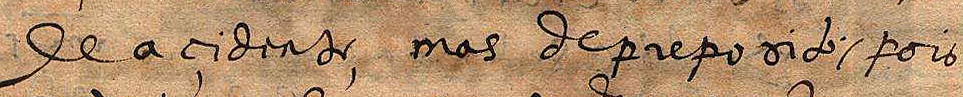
de açidente, mas de preposito / pois
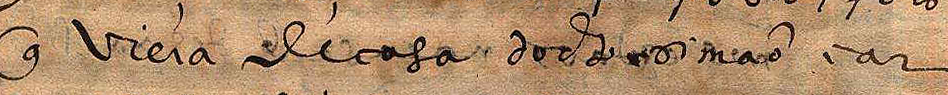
q̄ viera de casa do dto simaõ car
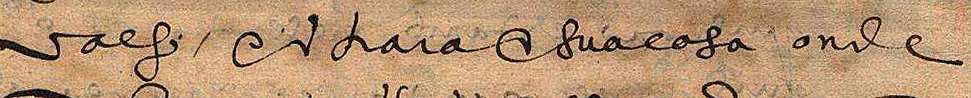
valho / e e̅trara ē sua casa onde
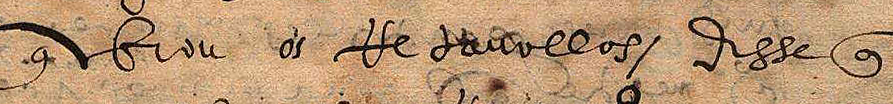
q̅ebrou os Retauollos / disse q̄
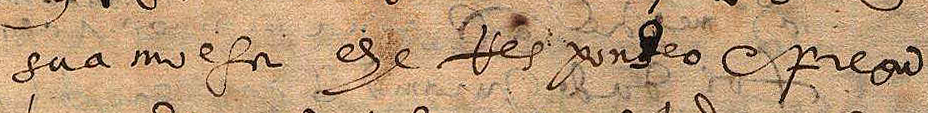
sua molher lhe Respondeo e pregū
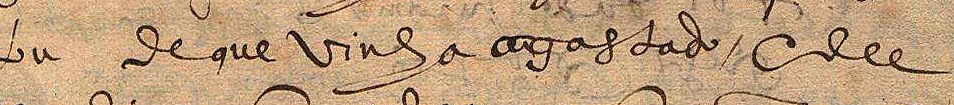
tou de que vinha agastado / e ele
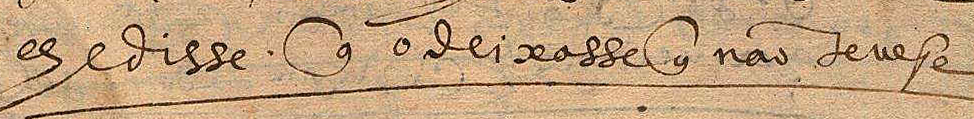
lhe disse q̄ o deixasse q̄ não teuesse
